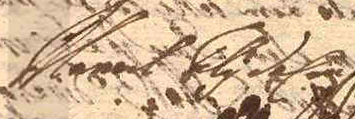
Manoel Felis da Cru
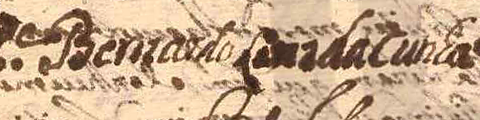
Bernardo Lens da cunha
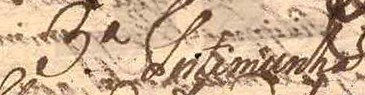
3.a Testimunha
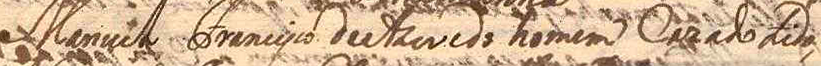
Manuel Francisco de Azevedo homem Cazado tido
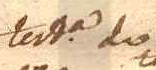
test.a do
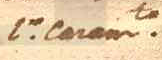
1.o cazamto.
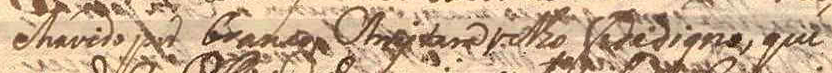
e havido por branco Christam velho fidedigno, que
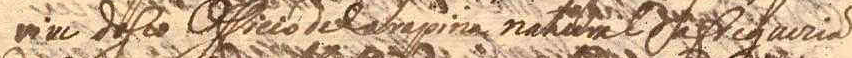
vive do seo Officio de Carapina natural da freguezia
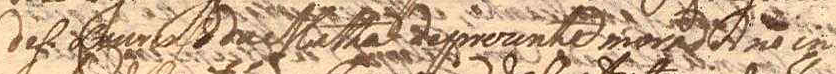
de s. Lourenso da Matta de prezente morador no in
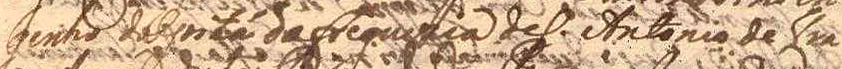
genho da Quinta da freguezia de S. Antonio de Tra
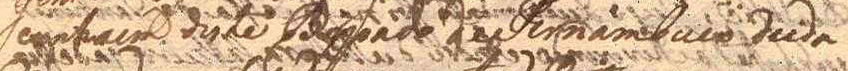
cunhaem deste Bispado de Pernambuco de ida
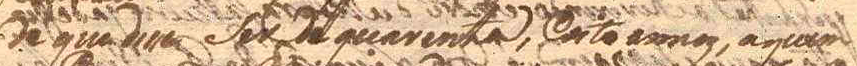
de que disse ser de quarenta, E oito annos, a quem
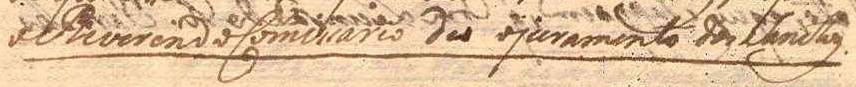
o Reverendo Comissario deo o juramento dos Sanctoz.
